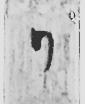人
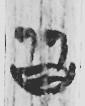皆
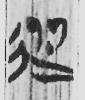從
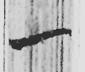一
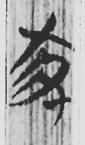豕
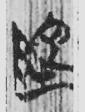地（地）
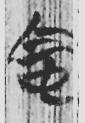{宀𠁩}（仲）
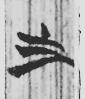之
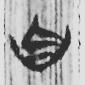自
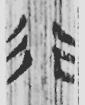行
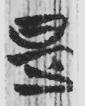是
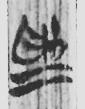爲
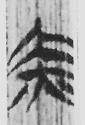赤
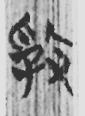{孚攴}
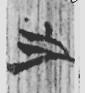之
